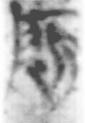所
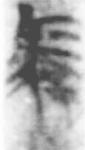馭（御）
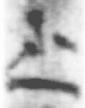少
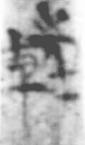○（廣）
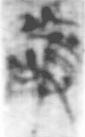雘
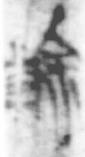輪
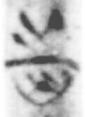齒
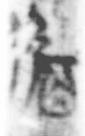弼
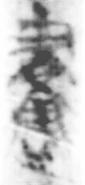○（畫）
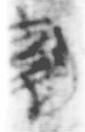韌
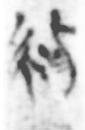紫
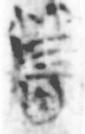○（席）
